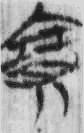賽
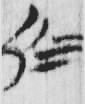於
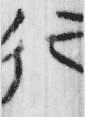行
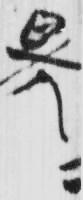犬白
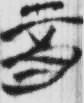酉（酒）
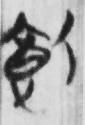○（食）
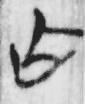占
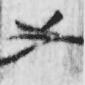之
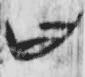曰
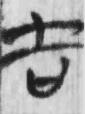吉
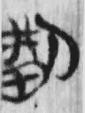○（荆）
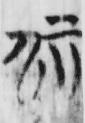𫵖
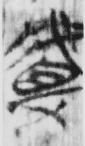且
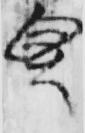見
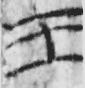王
